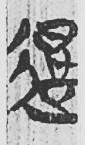逗
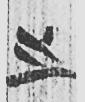之
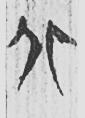北
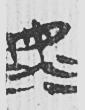{水母}
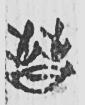晉
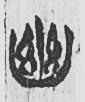幽
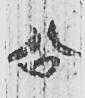公
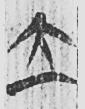立
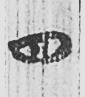四
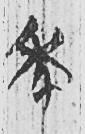年
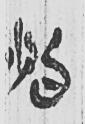{少勺}
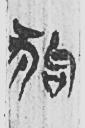狗
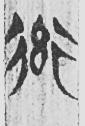率
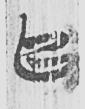𠂤
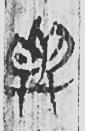與
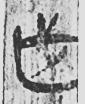戉
